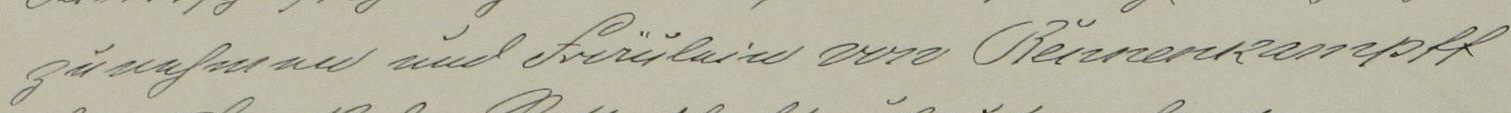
zunehmen und Fräulein von Rennenkampff
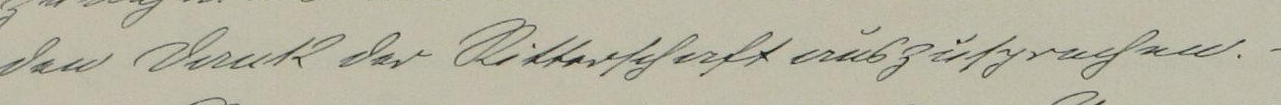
den Dank der Ritterschaft auszusprechen.
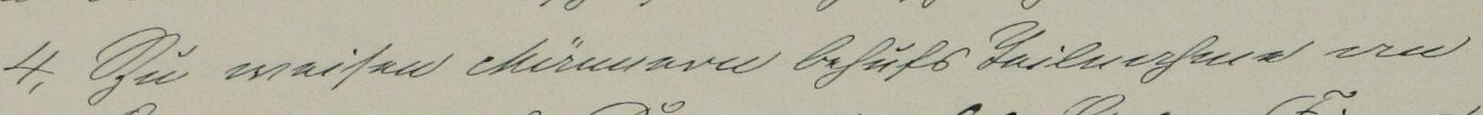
4. Zu weisen Männern behufs Teilnahme an
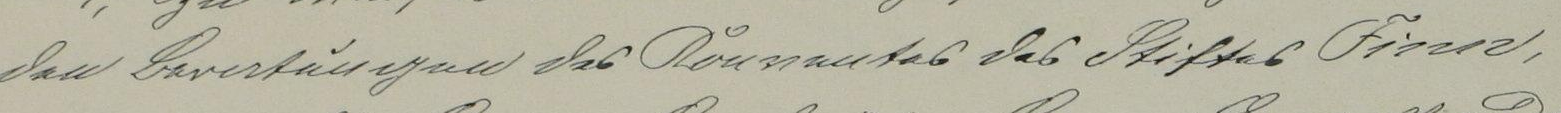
den Beratungen des Konventes des Stiftes Finn,
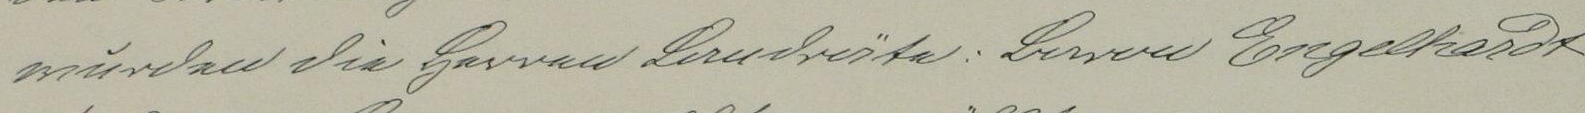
wurden die Herren Landräte: Baron Engelhardt
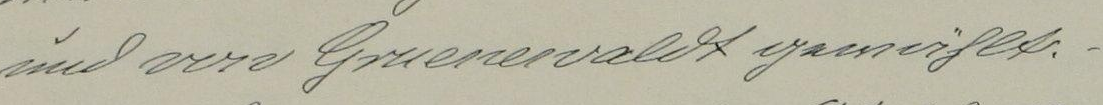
und von Gruenewaldt gewählt.
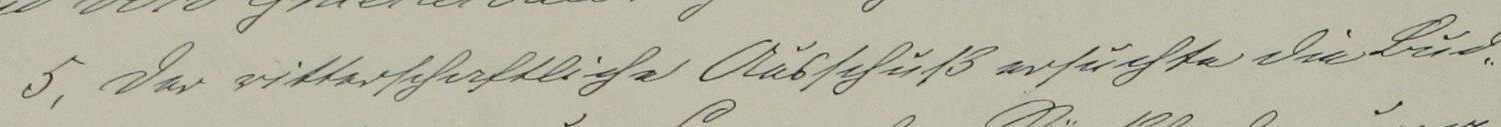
5. Der ritterschaftliche Ausschuß ersuchte die Bud-
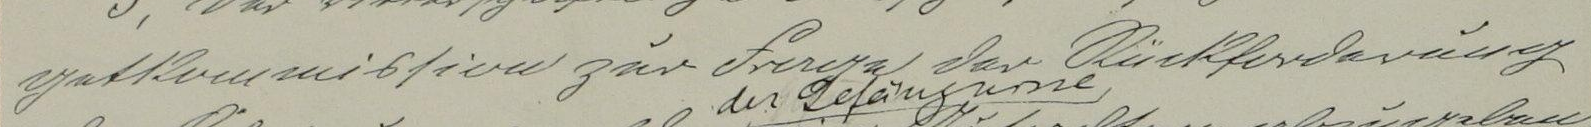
getkommission zur Frage der Rückforderung
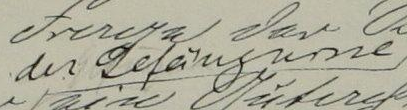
der Gefängnisse
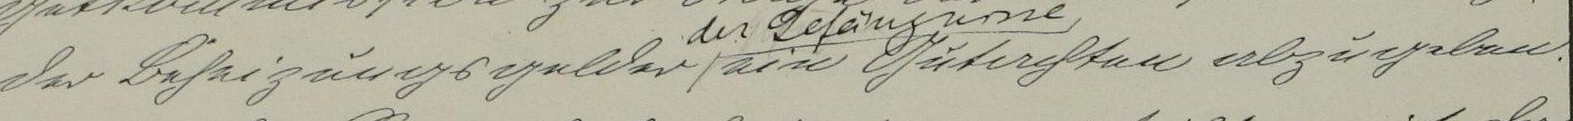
der Beheizungsgelder ein Gutachten abzugeben.
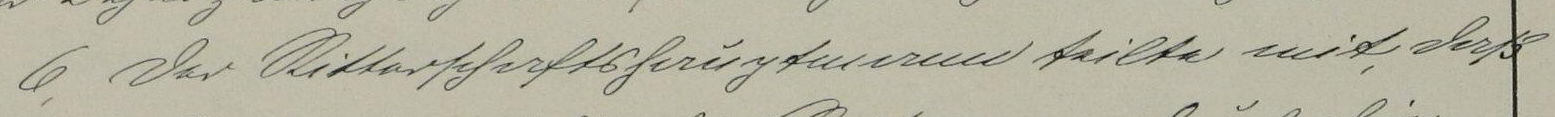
6. Der Ritterschaftshauptmann teilte mit, daß
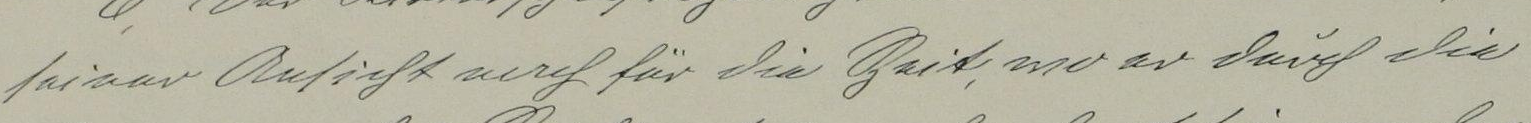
seiner Ansicht nach für die Zeit, wo er durch die
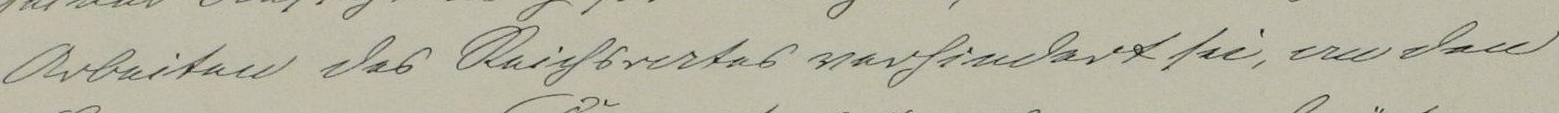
Arbeiten des Reichsrates verhindert sei, an den
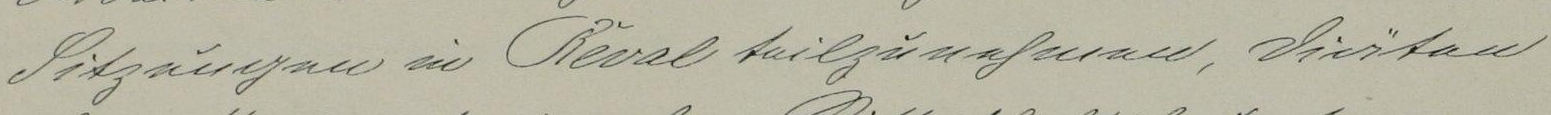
Sitzungen in Reval teilzunehmen, Diäten
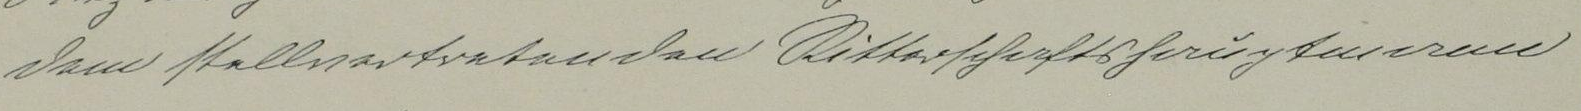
dem stellvertretenden Ritterschaftshauptmann
